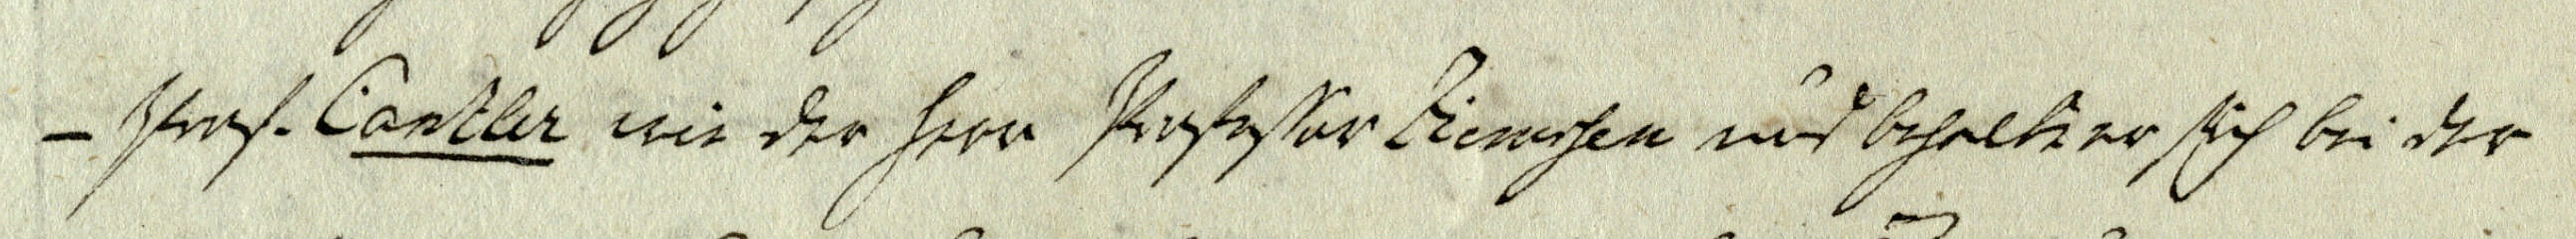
Prof. Canzler wie der Herr Professor Ziemssen und behalte er sich bei der
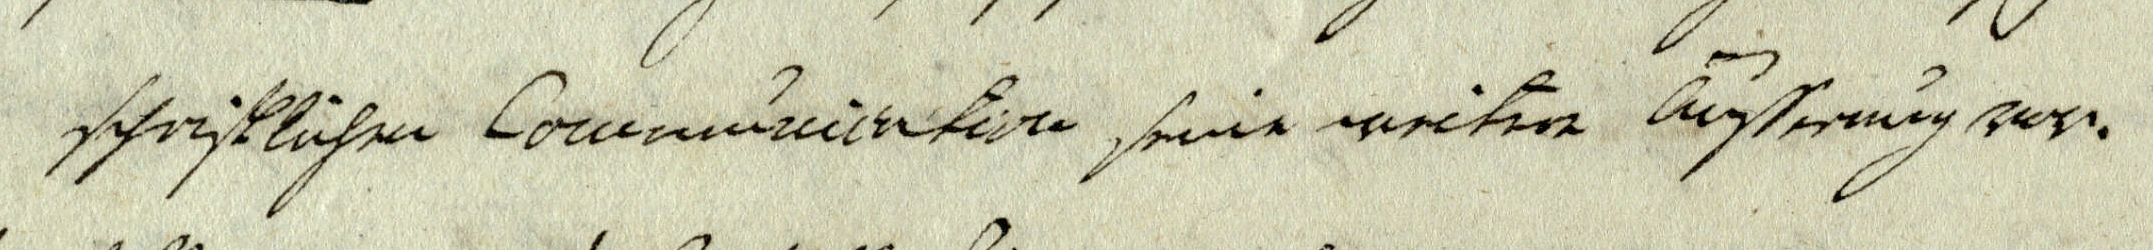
schriftlichen Communication seine weitere Äusserung vor¬
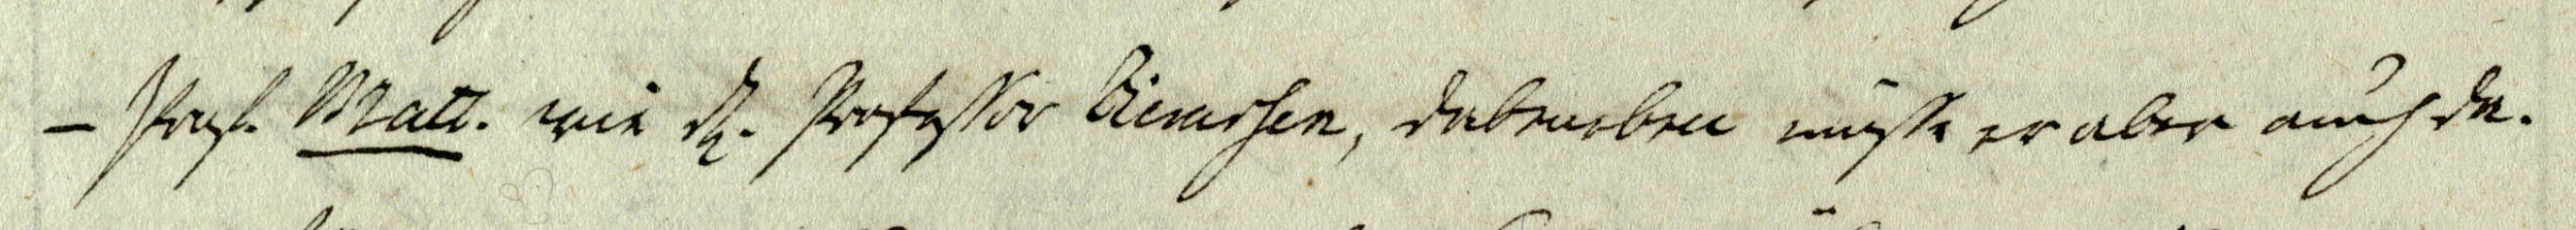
Prof. Bratt. wie dh. Professor Ziemssen, dabeneben müsse er aber auch da¬
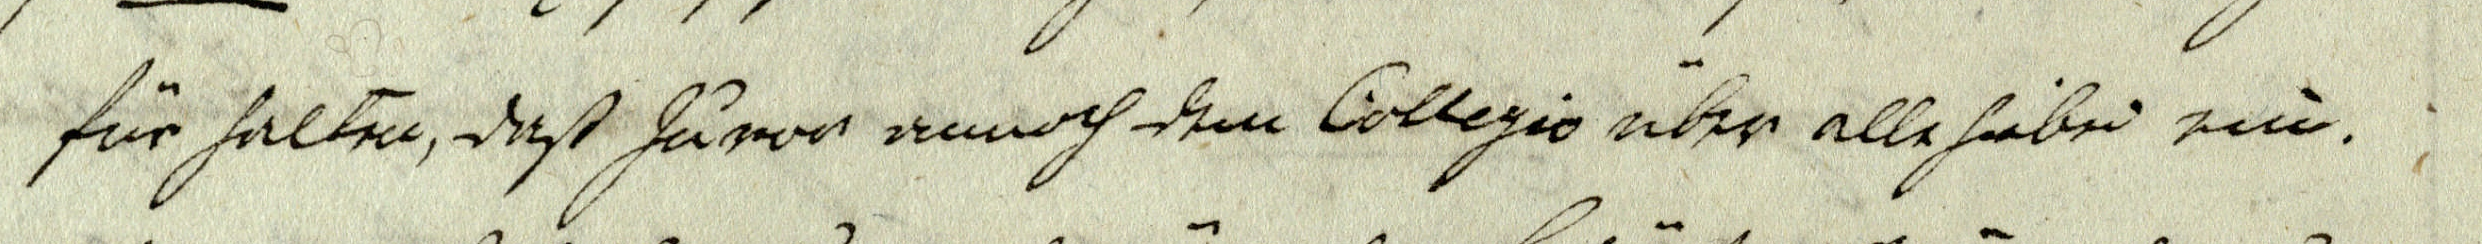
für halten, daß zuvor annoch dem Collegio über alle hiebei ein¬
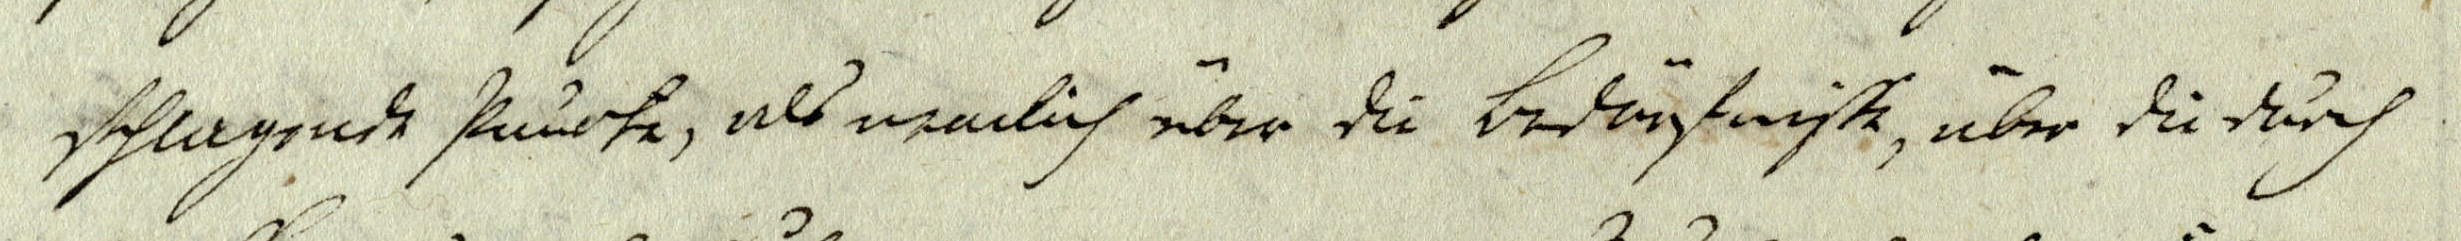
schlagende Puncte, als nemlich über die Bedürfnisse, über die durch
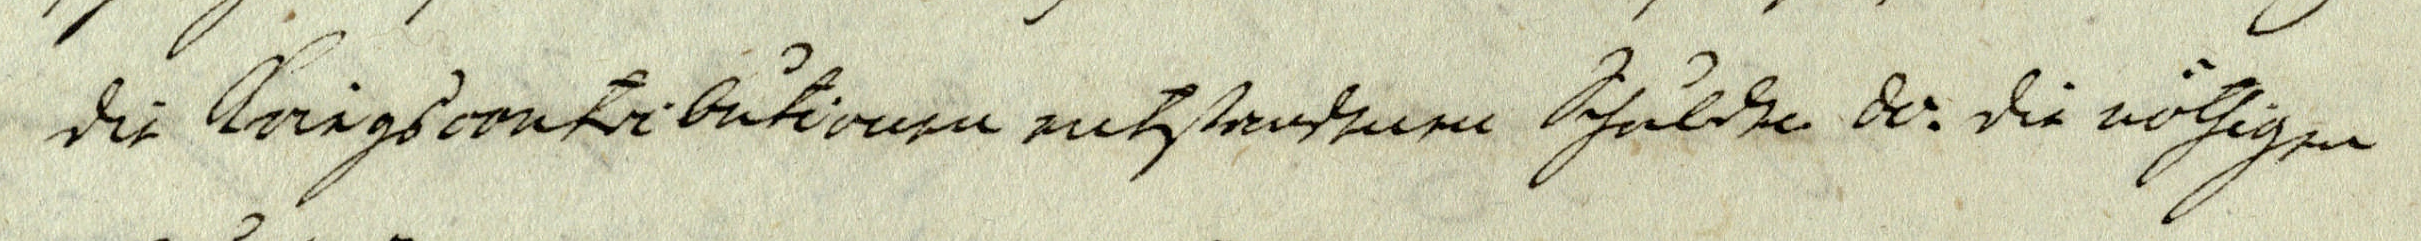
die Kriegscontributionen entstandenen Schulden do. die nöthigen
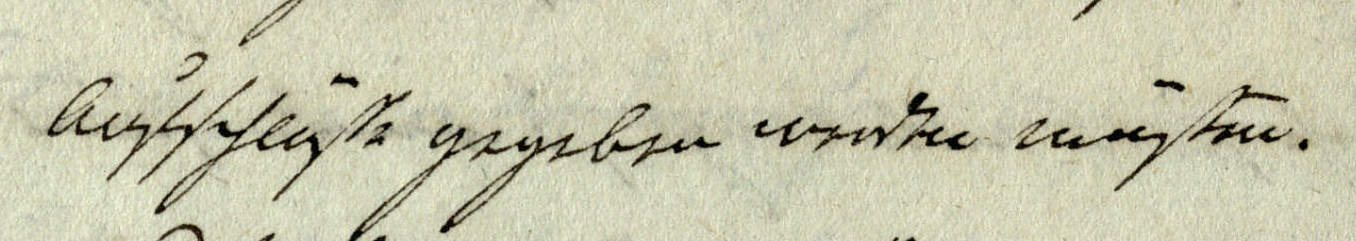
Aufschlüsse gegeben werden müsten.
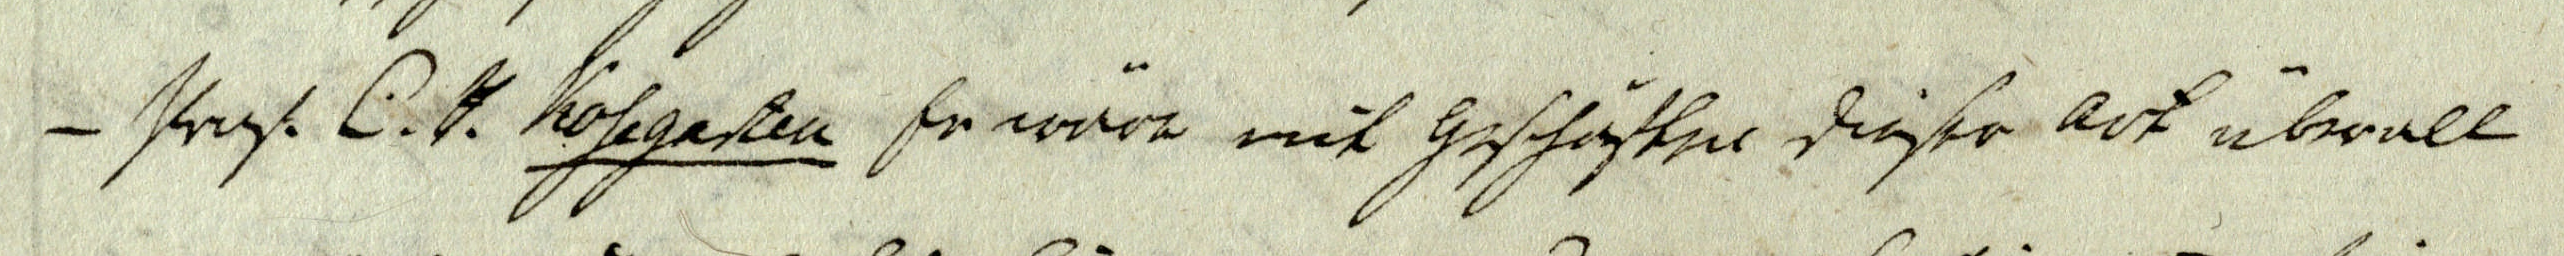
Prof. C. R. Kosegarten Er wäre mit Geschäften dieser Art überall
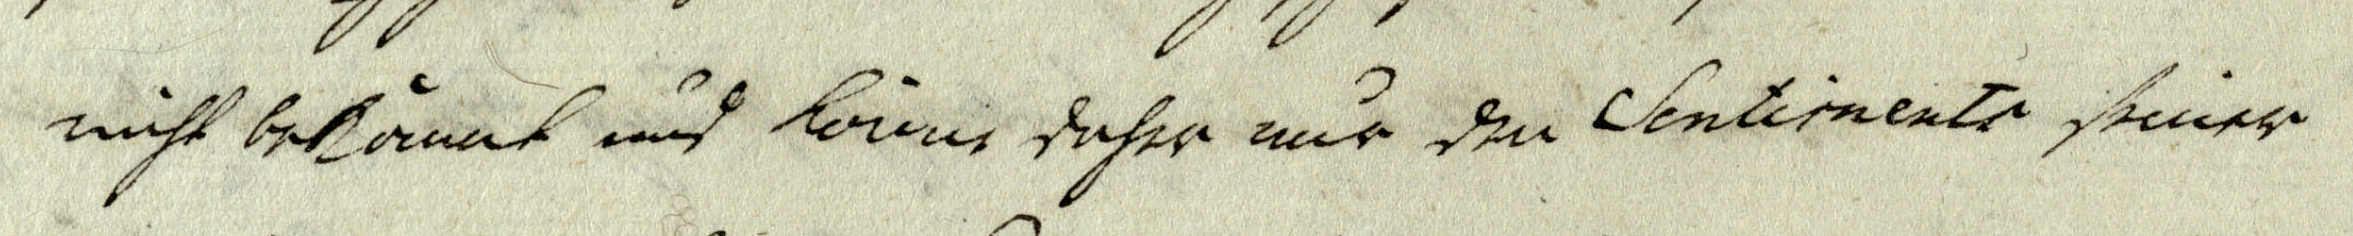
nicht bekannt und könne daher nur den Sentiments seiner
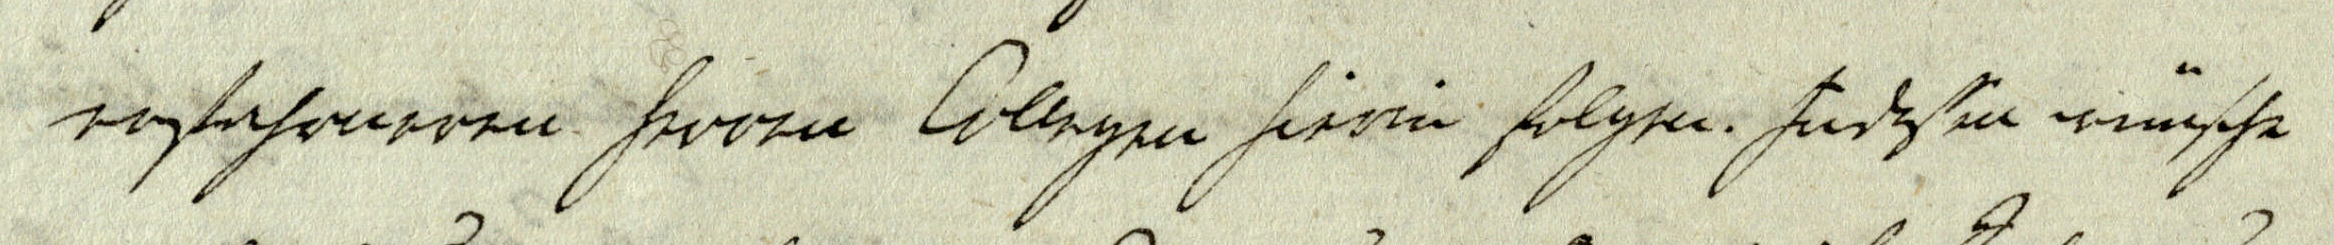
erfahrneren Herren Collegen hierin folgen. Indessen wünsche
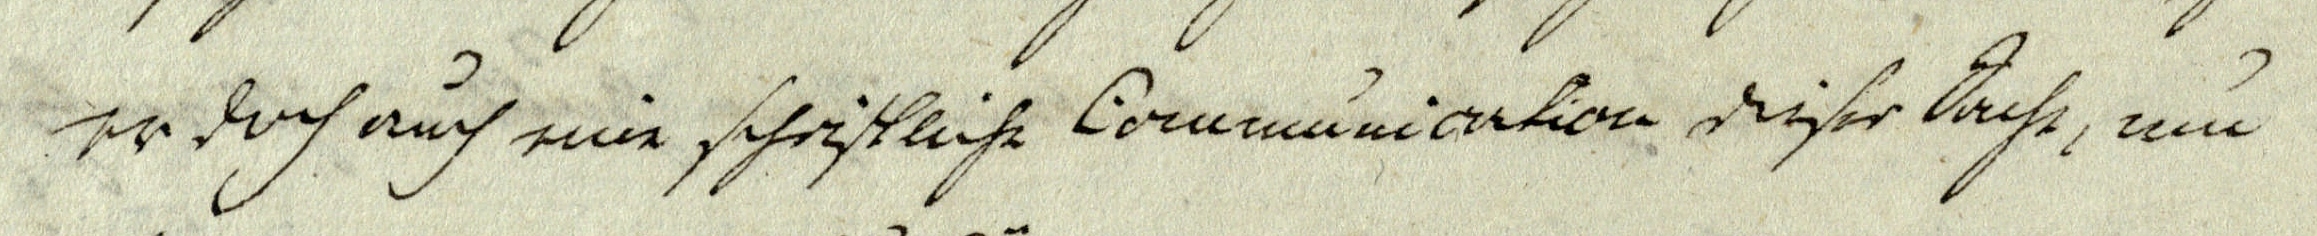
er doch auch eine schriftliche Communication dieser Sache, um
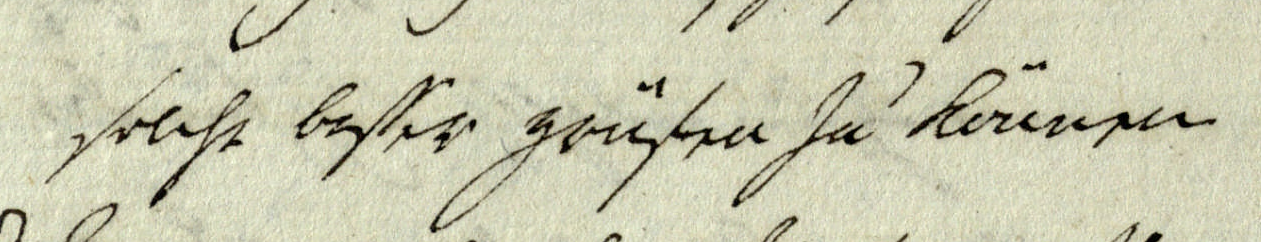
solche besser prüfen zu können.
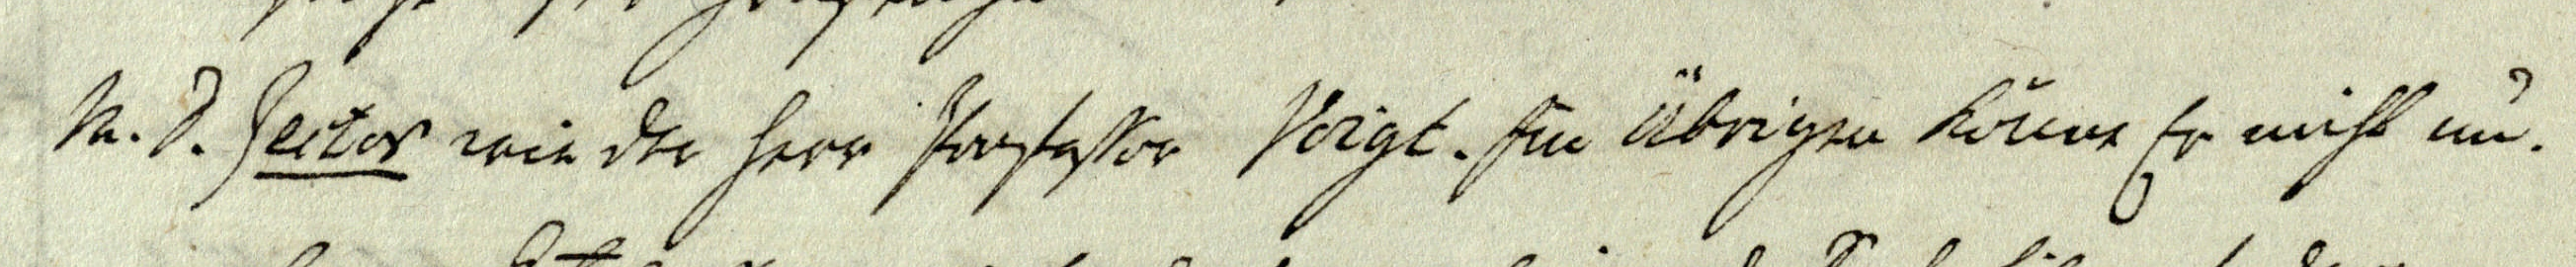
M. D. Rector wie der Herr Professor Voigt. Im übrigen könne Er nicht un¬
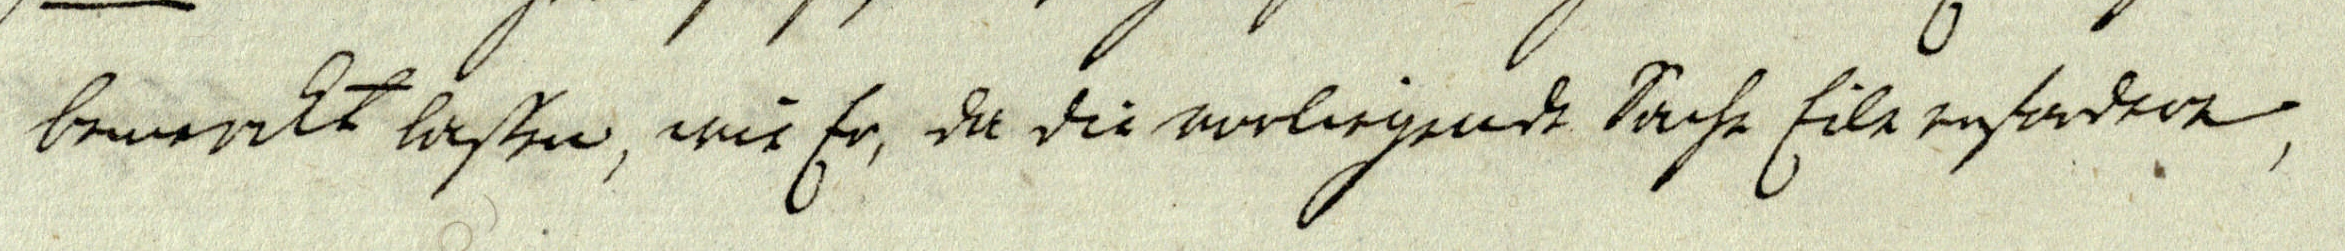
bemerkt lassen, wie Er, da die vorliegende Sache Eile erfordere,
